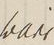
bedaure
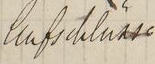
sehr notwen-
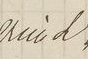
satzlosen
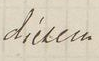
Verhältniss
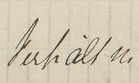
Melegari ist
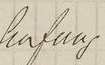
Anfang
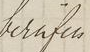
berufen um
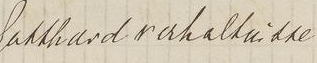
Gotthardverhältnisse
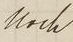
hatte
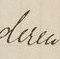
eine
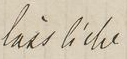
mit ihm,
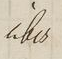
bei deren
